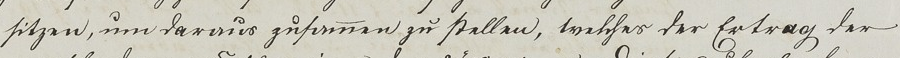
sitzen, um daraus zusammen zu stellen, welches der Ertrag der
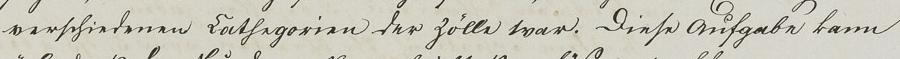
verschiedenen Cathegorien der Zölle war. Diese Aufgabe kann
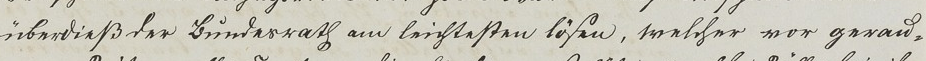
überdieß der Bundesrath am leichtesten lösen, welcher vor gerau-
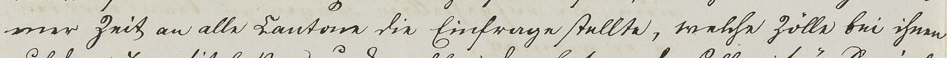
mer Zeit, an alle Cantone die Einfrage stellte, welche Zölle bei ihnen
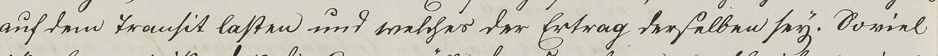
auf dem Transit lasten und welches der Ertrag derselben sey. Soviel
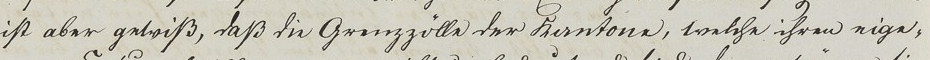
ist aber gewiß, daß die Grenzzölle der Kantone, welche ihren eige-
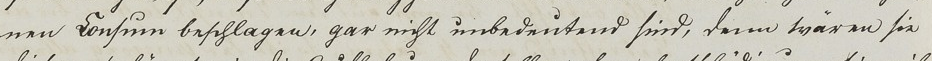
nen Consum beschlagen, gar nicht unbedeutend sind, denn wären sie
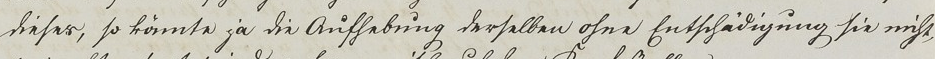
dieses, so könnte ja die Aufhebung derselben ohne Entschädigung sie nicht,
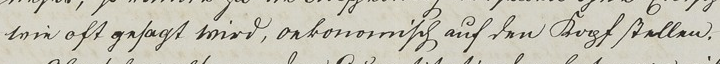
wie oft gesagt wird, oekonomisch auf den Kopf stellen.
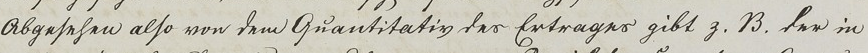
Abgesehen also von dem Quantitativ des Ertrages gibt z. B. der in
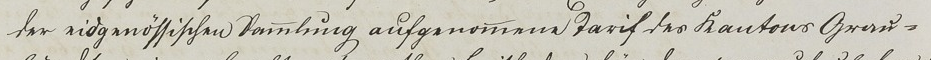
der eidgenössischen Sammlung aufgenommene Tarif des Kantons Grau-
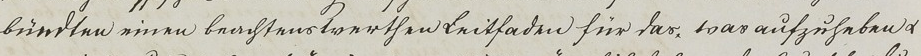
bündten einen beachtenswerthen Leitfaden für das was aufzuheben &
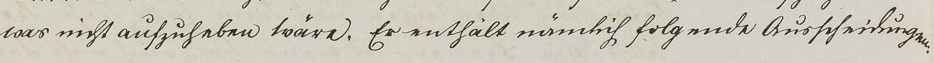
was nicht aufzuheben wäre. Er enthält nämlich folgende Ausscheidungen.
